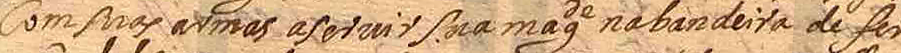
Com suas armas a seruir sua magde na bandeira de fer
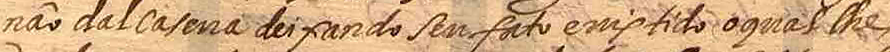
não dalcaseua deixando seu fato e uistido o qual lhe
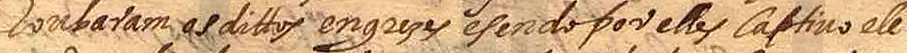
Roubaram os dittos engrezes e sendo por elles Captiuo e le
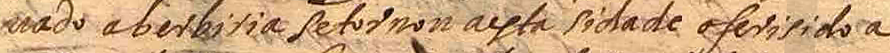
uado a berbiria se tornou a esta sidade oferisido a
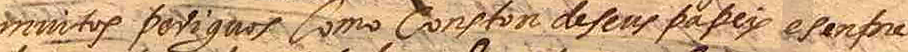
muitos periguos Como Constou de seus papeis e senpre
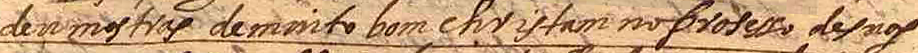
deu mostras de muito bom christam no prosesso de suas
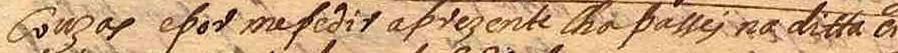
Couzas e por me pedir a prezente lha passej na ditta ci
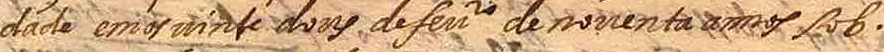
dade em os uinte dous de feuro de nouenta annos sob.
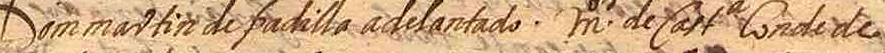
Dom martin de padilla adelantado. M.or de Casta Conde de
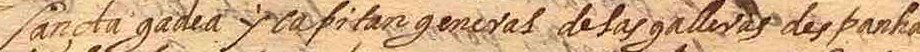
Sancta gadea y capitan general de las galleras despanha
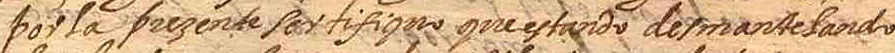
por la prezente sertifiquo que estando desmantelando
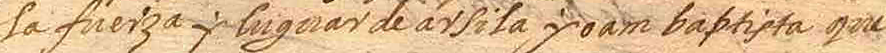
la fuerza y luguar de arsila yoam baptista que
